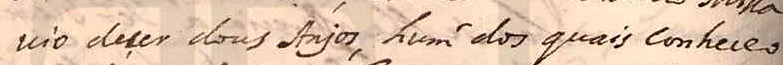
uio decer dous Anjos, hum dos quais conheceo
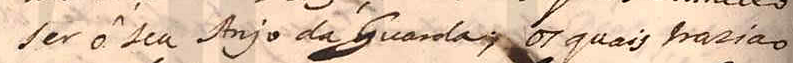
ser o seu Anjo da Guarda; os quais traziaõ
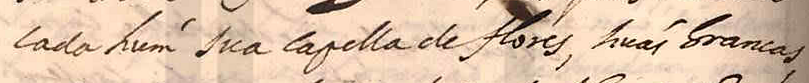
cada hum sua capella de flores, huās brancas,
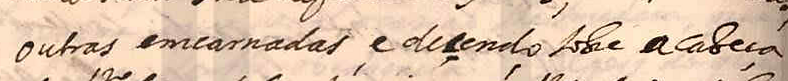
outras emcarnadas, e decendo sobre a cabeça
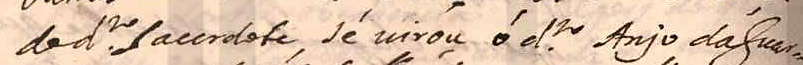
do d.to Sacerdote, se uirou ó d.to Anjo da Guar
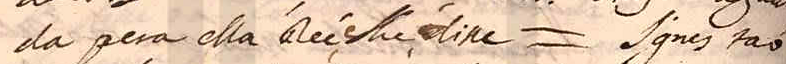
da pera ella Reé, e lhe, disse = Ignes taõ
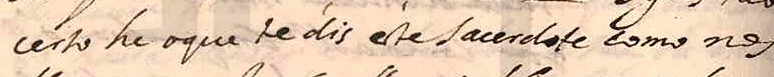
certo he o que te dis este sacerdote como nos
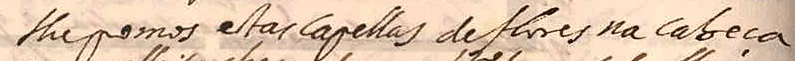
lhe pomos estas Capellas de flores na cabeça
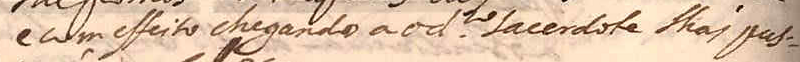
e com effeito chegando ao d.to sacerdote lhas pus
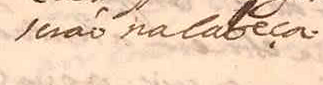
seraõ na cabeça.
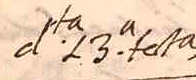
d.ta 13.a testa
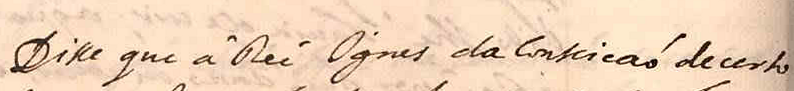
Disse que a Reé Ignes da Conseiçaõ de certo
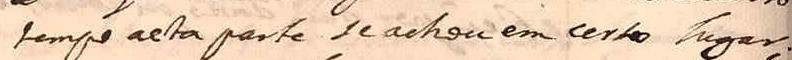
tempo a esta parte se achou em certo lugar;
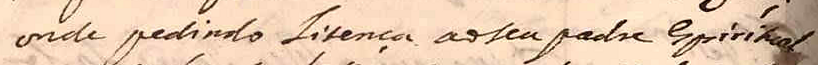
onde pedindo lisença ao seu padre Espiritual
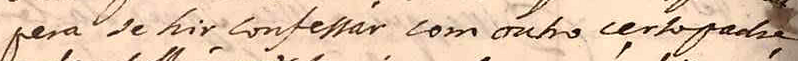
pera se hir confessar com outro certo padre,
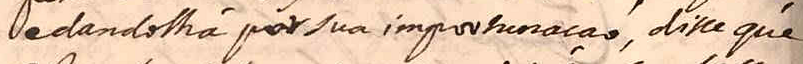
e dandolhá por sua importunaçaõ, disse que
